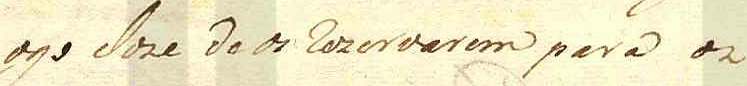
ogo Ioze de os Rezervarem para oz
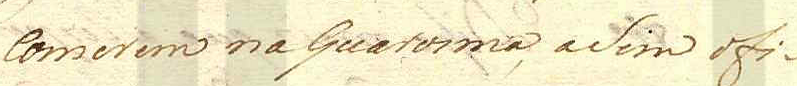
comerem na Quaresma, asim o fi
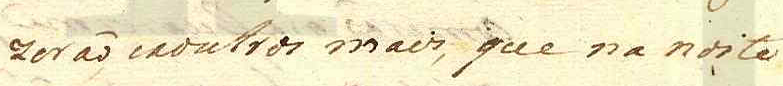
zeraõ e a outros mais, que na noite
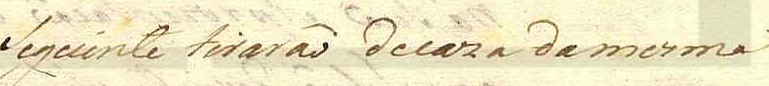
seguinte tiraraõ de caza da mesma
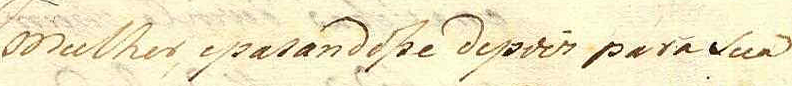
mulher e pasandosse depois para sua
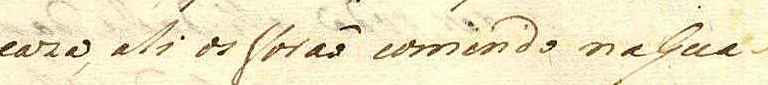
caza, ali os foraõ comendo na Qua
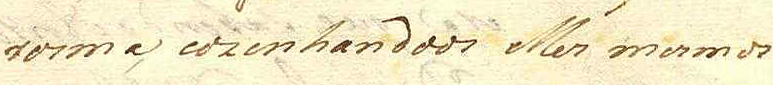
resma, cozinhandoos elles mesmos
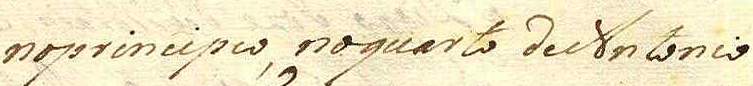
no principio, no quarto de Antonio
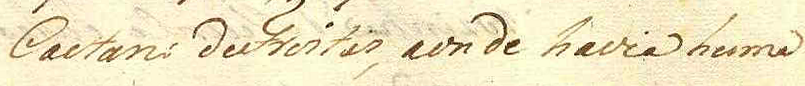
Caetano de Freitas, aonde havia huma
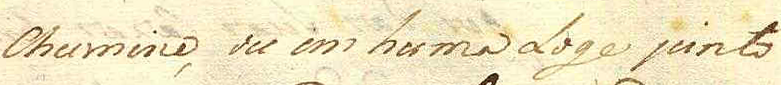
Chumine, ou em huma Loge junto
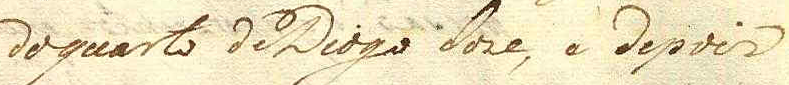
do quarto de Diogo Ioze, e depois
